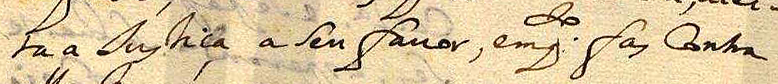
ta a Iustiça a seu fauor, emq.to fas Contra
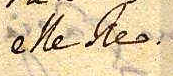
elle Reo.
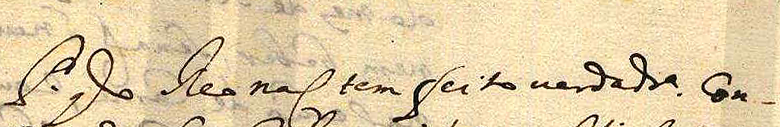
P. q̄ o Reo naꝭ tem feito uerdadra. con
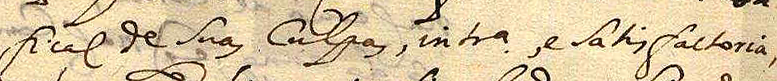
fiçaꝭ de suas culpas, intra., e satisfactoria,
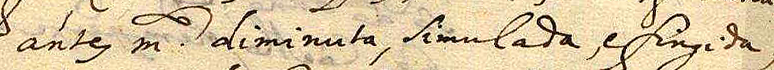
antes m.to diminuta, simulada, e fingida
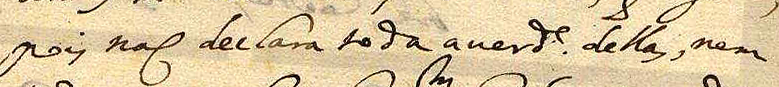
pois naꝭ declara toda a uerd.e dellas, nem
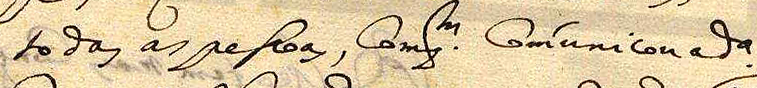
todas as pessoas, Com q.m Com̄unicou a d.a
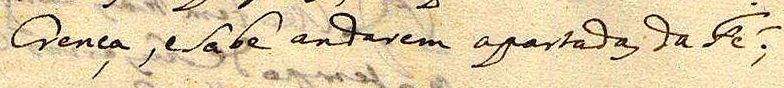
Crença, e Sabe andarem apartadas da Fé;
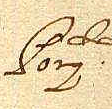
Porq.to
